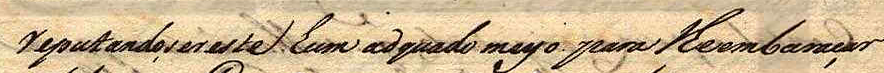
reputando, ser este hum adquado meyo para lhe embaraçar
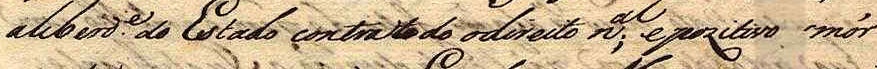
a liberd.e do Estado contra todo o direito n.al; e pozitivo, mór
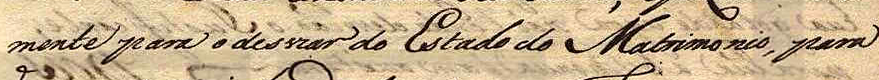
mente para o desviar do Estado do Matrimonio, para
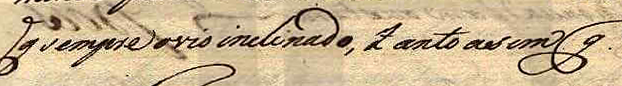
q̄ sempre o vio inclinado, tanto asim q̄.
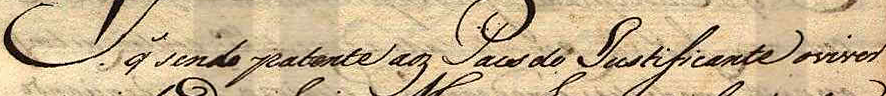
I. q̄ sendo patente aoz Pais do Iustificante o viver
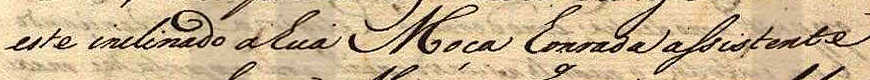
este inclinado a hua Moça honrada assistente
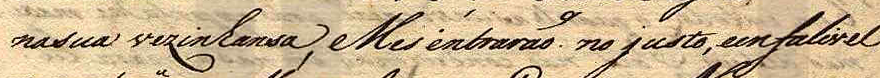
na sua vezinhansa, elles intraraõ no justo, e infalivel
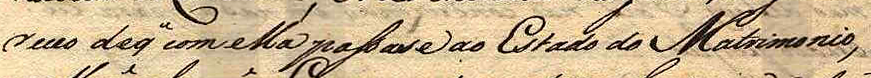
receo de q̄ com ella passase ao Estado do Matrimonio,
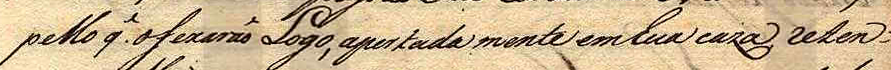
pello q̄ ofexaraõ Logo, apertadamente em hua caza, reten
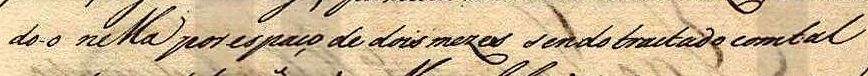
do-o nella por espaço de dois mezes, sendo tractado com tal
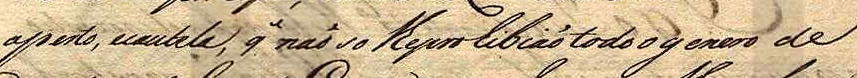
aperto, e cautela, q̄ naõ só lhe prohibiaõ todo o genero de
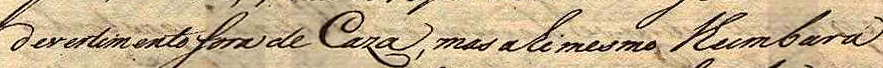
devertimento fora de Caza, mas ahi mesmo lhe imbara
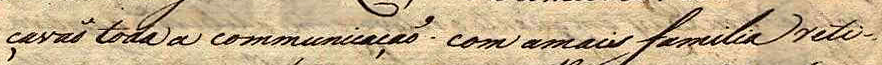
çavaõ toda a comunicaçaõ com a mais familia reti
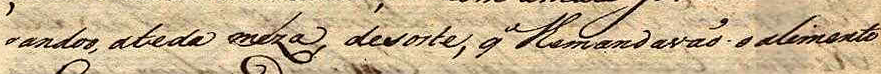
randoo, a toda meza, de sorte, q̄ lhe mandavaõ o alimento
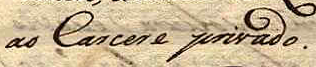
ao Carcere privado.
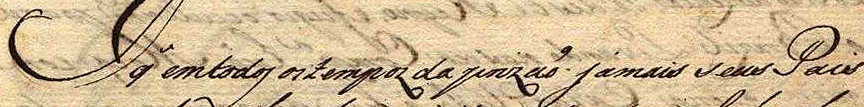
I q̄ em todos os tempoz da prizaõ jamais seus Pais
